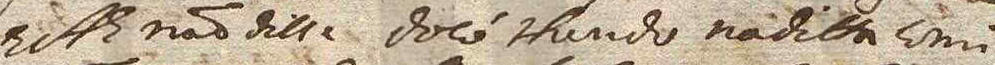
E Al naõ disse do cōtheudo na ditta comi
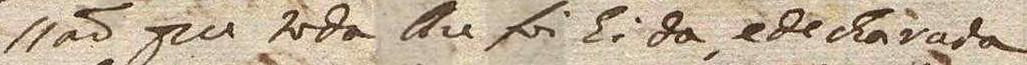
ssão que toda lhe foi lida, e declarada
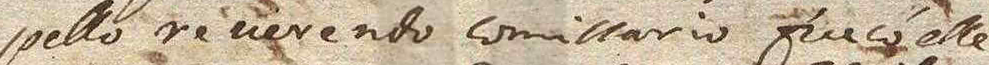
pello reuerendo comissario que cō elle
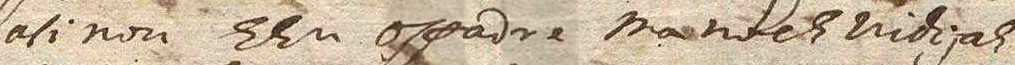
asinou E Eu o padre manoel vidigal
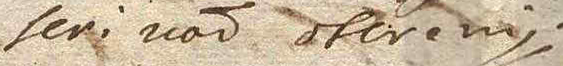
scriuão o screuy.
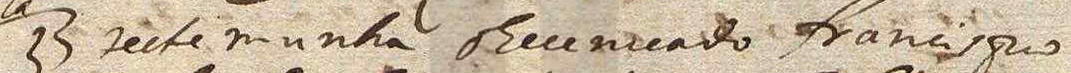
item testemunha o leçençeado françisquo
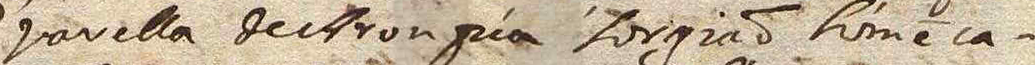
varella de Arouqua sorgião homē ca
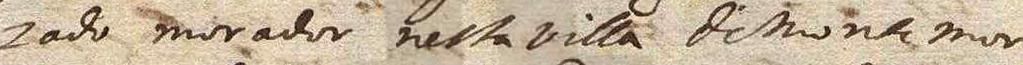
zado morador nesta villa de montemor
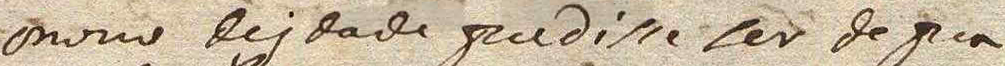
o nouo de jdade que disse ser de qua
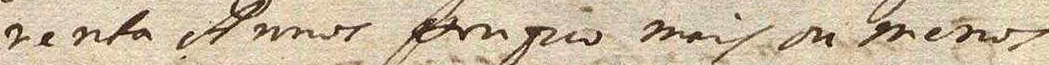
renta Annos pouquo mais ou menos
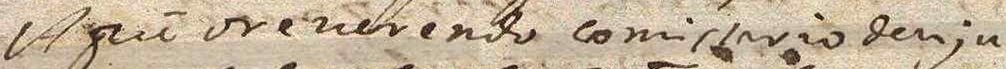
A quē o reuerendo comissario deu ju
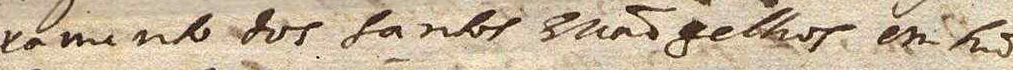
ramento dos santos Euãogelhos em hū
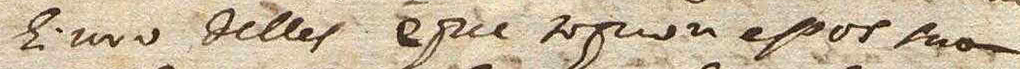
liuro delles e que toquou e pos sua
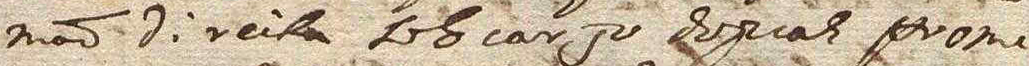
maõ direita sob cargo do qual prome
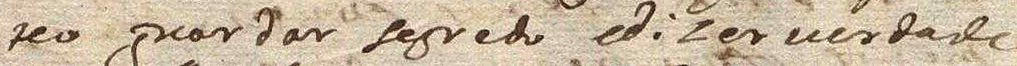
teo guardar segredo e dizer uerdade
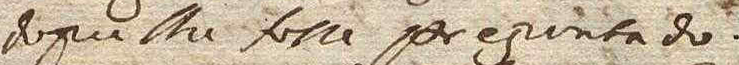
do que lhe fosse preguntado.
